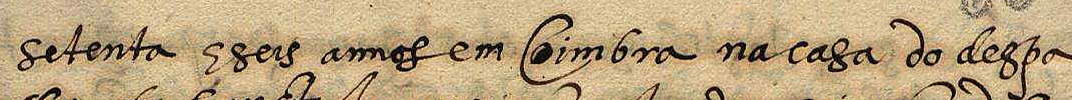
setenta E seis annos em Coimbra na casa do despa
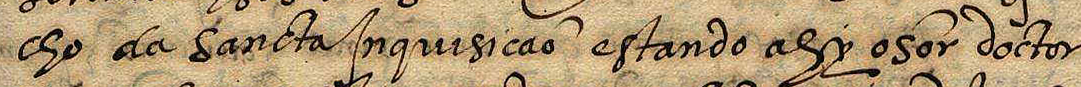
cho da Sancta Jnquisição estando ahy o so̅r doctor
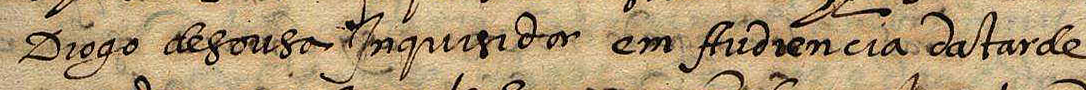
Diogo de sousa Jnquisidor em Audiencia da tarde
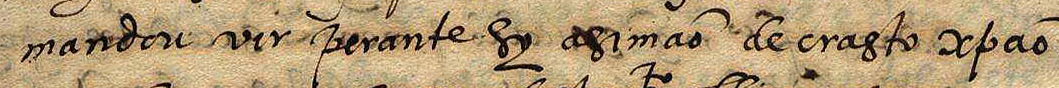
mandou vir perante sy a simaõ de crasto xpaõ
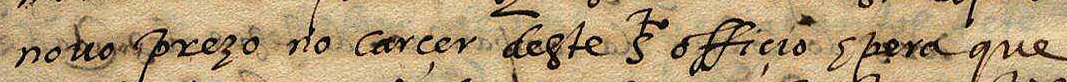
nouo prezo no carcer deste sto officio E pera que
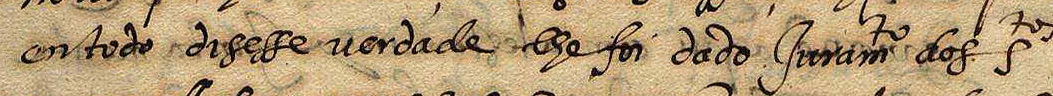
en todo disesse uerdade lhe foi dado Juramto dos stos
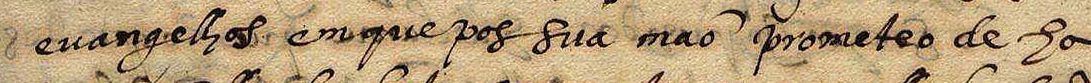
euangelhos em que pos sua maõ prometeo de ha
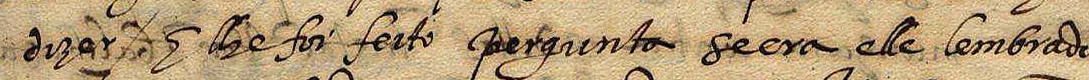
dizer / E lhe foi feito pergunta se era elle lembrado
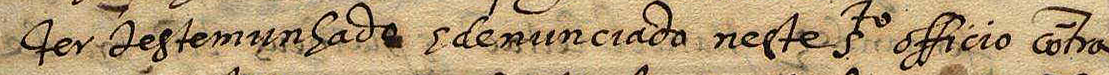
ter testemunhado E denunciado neste sto officio cōtra
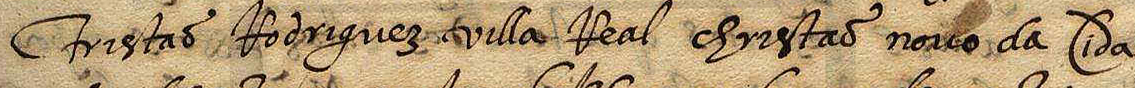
tristaõ Rodriguez villa Real christaõ nouo da Cida
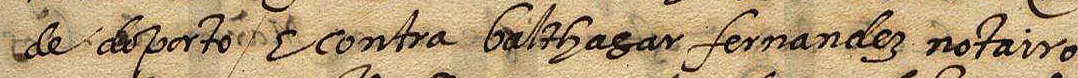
de do porto / E contra balthasar fernandez notairo
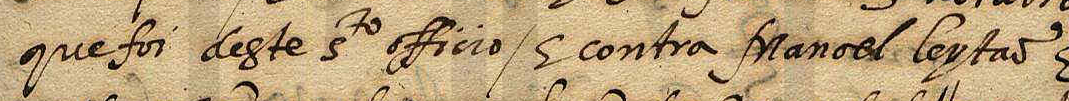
que foi deste sto officio / E contra Manoel leytaõ E
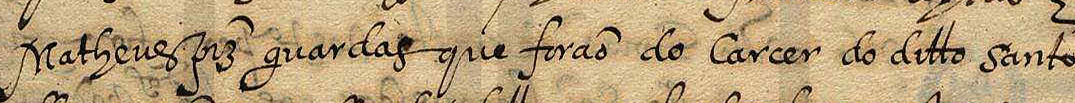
Matheus piz̄ guardas que foraõ do Carcer do ditto santo
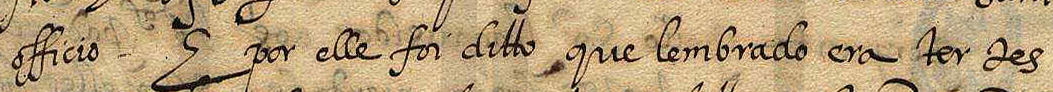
officio. E por elle foi ditto que lembrado era ter tes
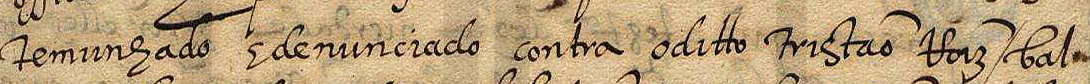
temunhado E denunciado contra o ditto tristaõ Roiz̄ / bal
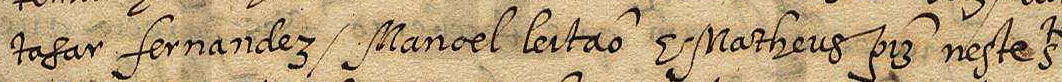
tasar fernandez / Manoel leitaõ E Matheus piz̄ neste sto
